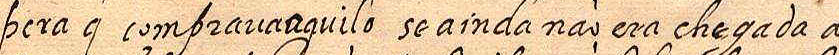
pera q̄ compraua aquilo se ainda naõ era chegada a
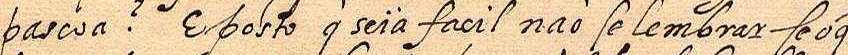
pascoa? E posto q̄ seia façil naõ se lembrar se o q̄
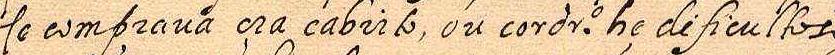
se compraua era cabrito, ou cordr.o he dificultoso
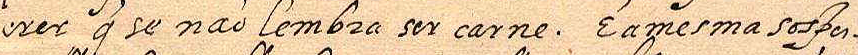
crer, q̄ se naõ lembra ser carne. E a mesma sospei
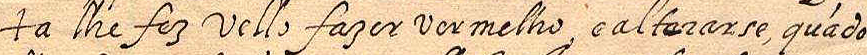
ta lhe fez vello fazer vermelho, e alterarse, quādo
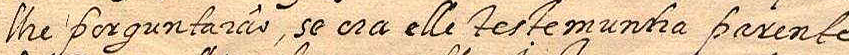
lhe pergutarão, se era elle testemunha parente
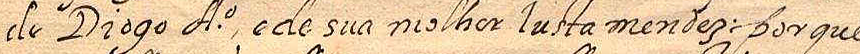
de Diogo A.o, e de sua molher Iusta mendez: porque
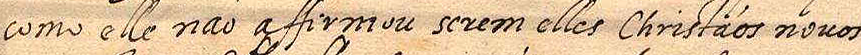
como elle naõ affirmou serem elles Christaõs nouos
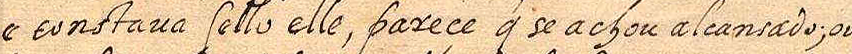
e constaua sello elle, pareçe q̄ se achou alcansado, ou
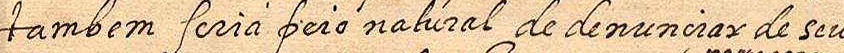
tambem seria peio natural de denunçiar de seu
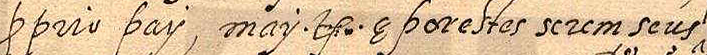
ꝓprio pay, may c̄ꝭ. E por estes serem seus
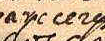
pareceres
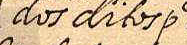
dos ditos pes.
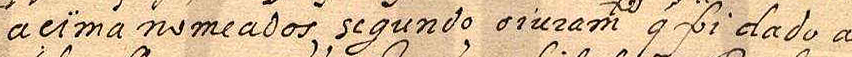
açima nomeados, segundo o iuramto q̄ foi dado a
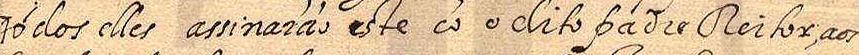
todos elles assinarão este cō o dito padre Reitor, aos
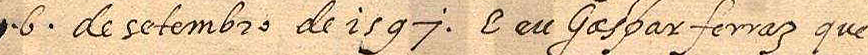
.6. de setembro de i597. E eu Gaspar ferraz que
